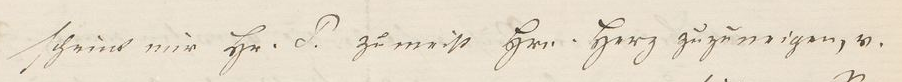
scheint mir Hr. P. zumeist Hrn. Herz zuzuneigen, v.
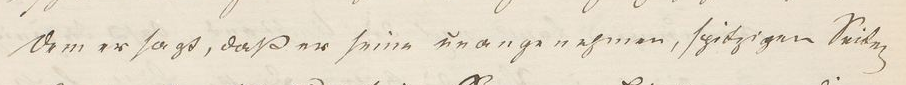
dem er sagt, daß er seine unangenehmen, spitzigen Seiten
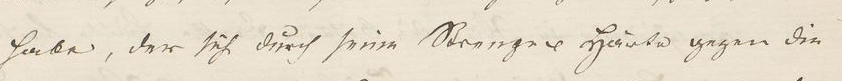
habe, der sich durch seine Strenge & Härte gegen die
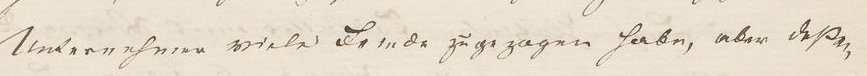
Unternehmer viele Feinde zugezogen habe, aber deßen
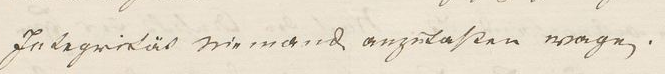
Integrität niemand anzutasten wage. –
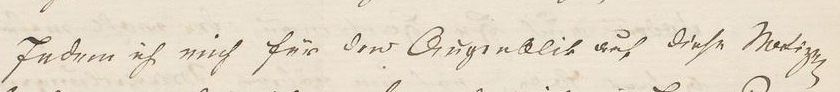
Indem ich mich für den Augenblik auf diese Notizen
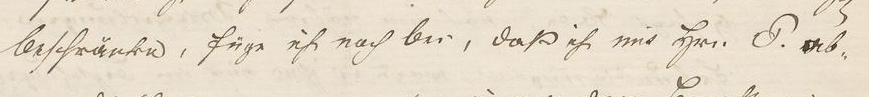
beschränke, füge ich noch bei, daß ich mit Hrn. P. ab-
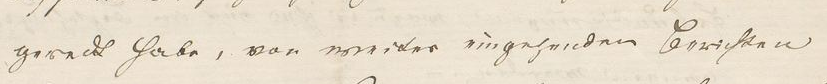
geredt habe, von weiter eingehenden Berichten
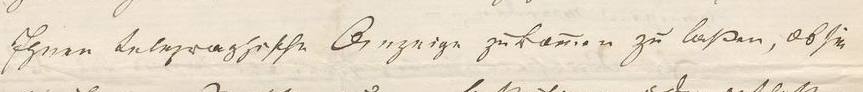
Ihnen telegraphische Anzeige zukommen zu laßen, ob sie
